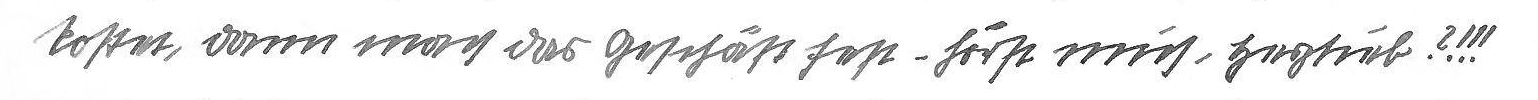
kostet, dann mach das Geschäft fest – hörst mich, Herzlieb?!!!
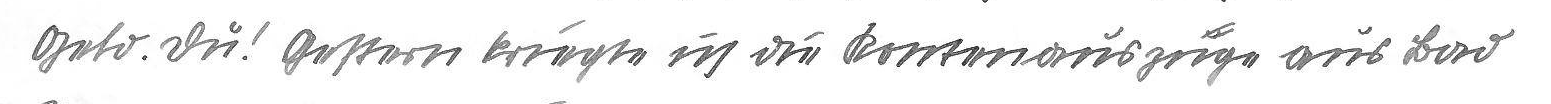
Geld. Du! Gestern kriegte ich die Kontoauszüge aus Bad
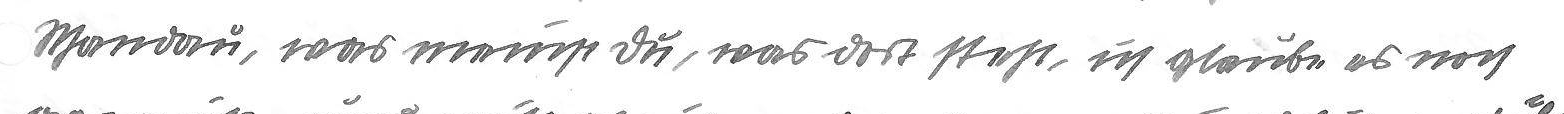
Sch., was meinst Du, was dort steht, ich glaube es noch
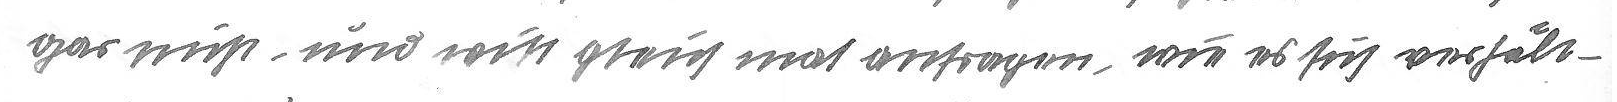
gar nicht, und will gleich mal anfragen, wie es sich verhält –
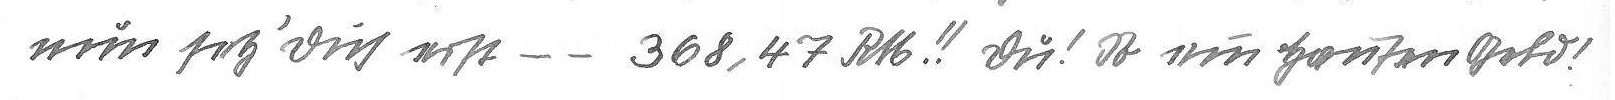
nun setz’ Dich erst – – 368,47 RM!! Du!! So ein Haufen Geld!
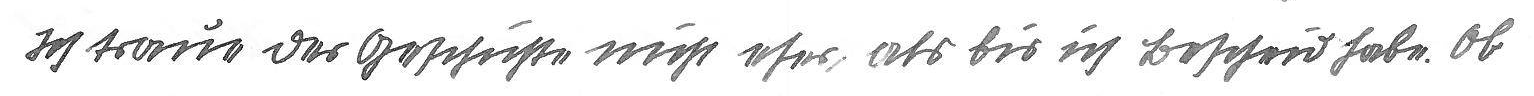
Ich traue der Geschichte nicht eher, als bis ich Bescheid habe. Ob
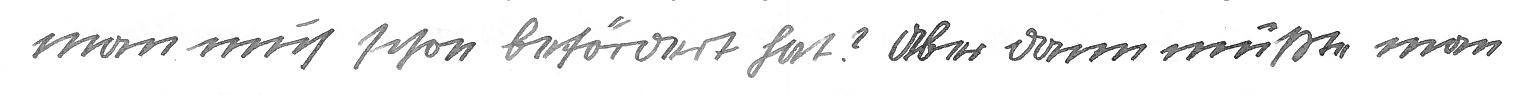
man mich schon befördert hat? Aber dann müßte man
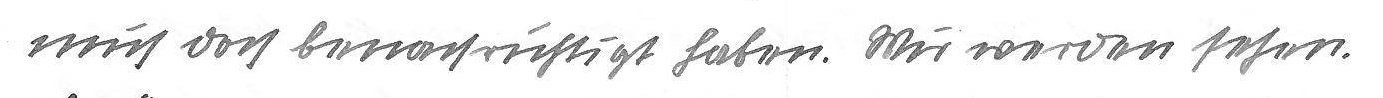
mich doch benachrichtigt haben. Wir werden sehen.
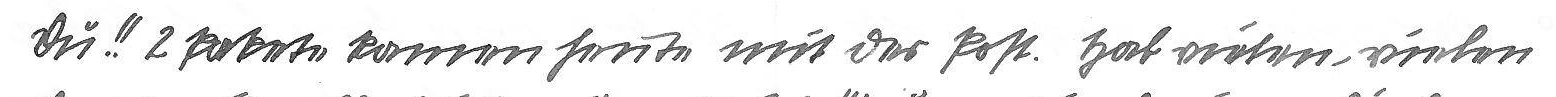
Du!! 2 Pakete kamen heute mit der Post. Hab vielen, vielen
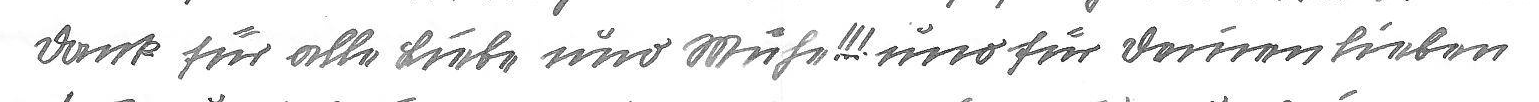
Dank für alle Liebe und Mühe!!! und für Deinen lieben
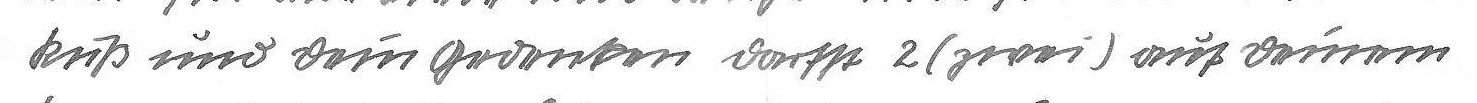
Kuß und Dein Gedenken darfst 2 (zwei) auf Deinem
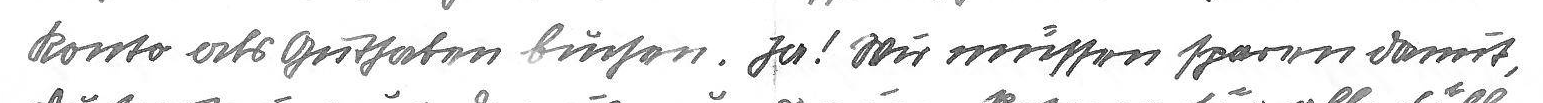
Konto als Guthaben buchen. Ja! Wir müssen sparen damit,
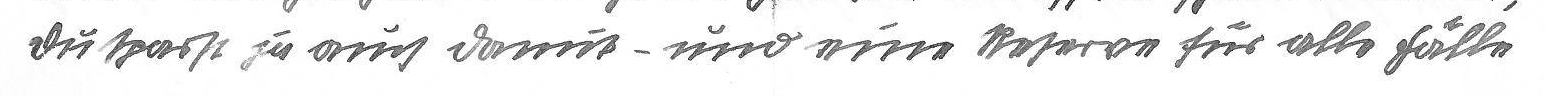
Du sparst ja auch damit – und eine Reserve für alle Fälle
